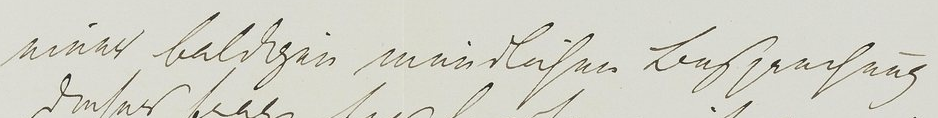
einer baldigen mündlichen Besprechung
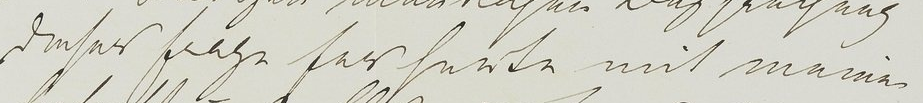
dieser Frage für heute mit meinen
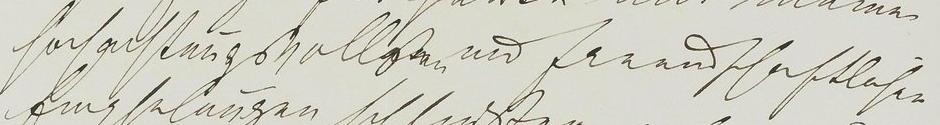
hochachtungsvollsten und freundschaftlichen
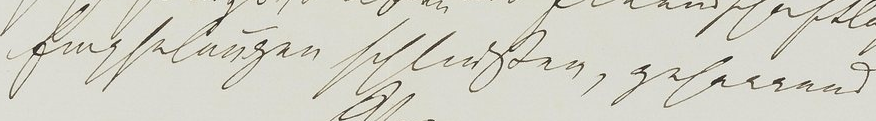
Empfelungen schließen, geharrend
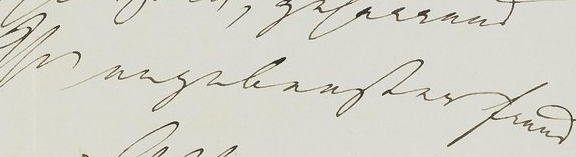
Ihr ergebenster Freund
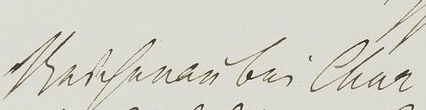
Reichenau bei Chur
